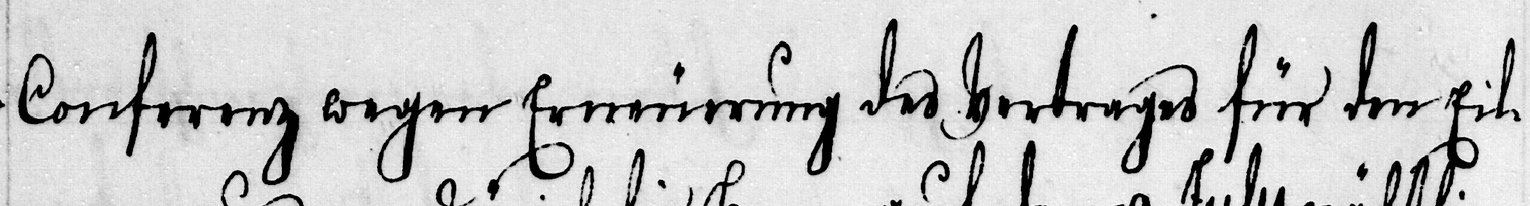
Conferenz wegen Erneuerung des Vertrages für den Eil¬
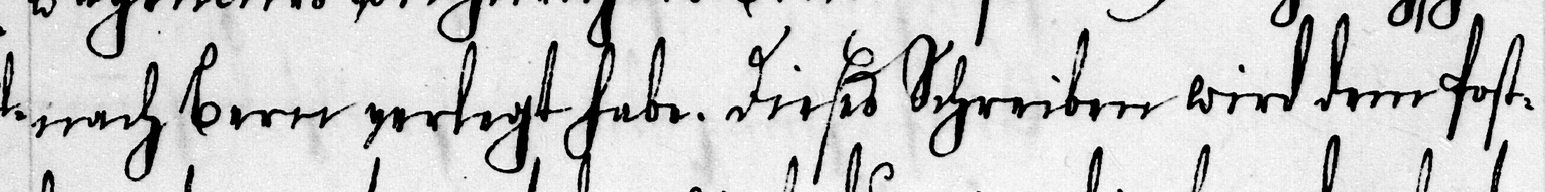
nach Bern verlegt habe. Dieses Schreiben wird dem Post¬
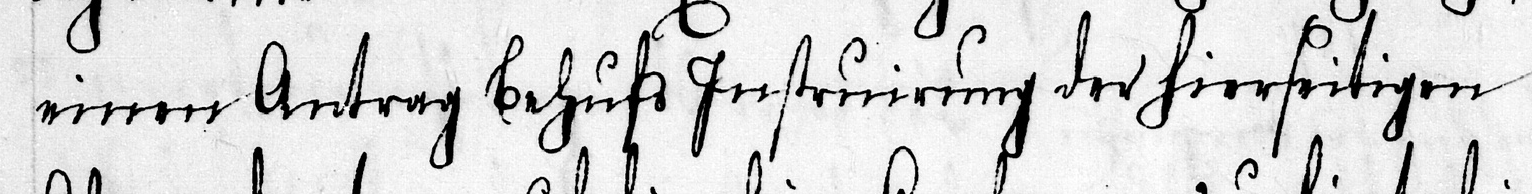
einen Antrag Behufs Instruirung der hierseitigen
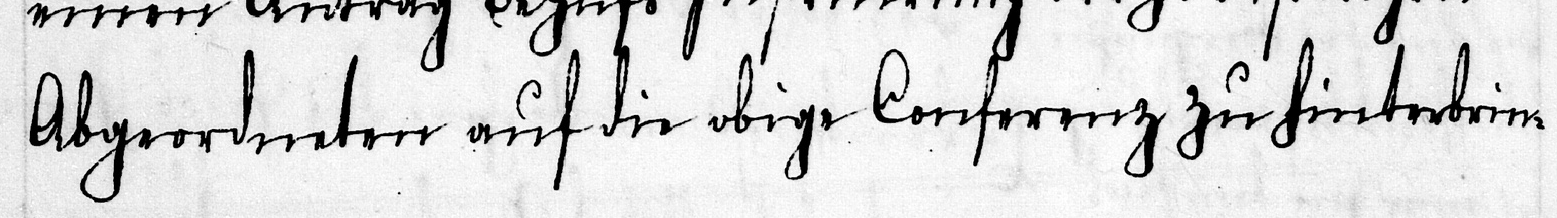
Abgeordneten auf die obige Conferenz zu hinterbrin¬
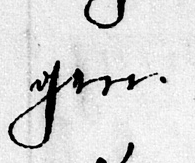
gen.
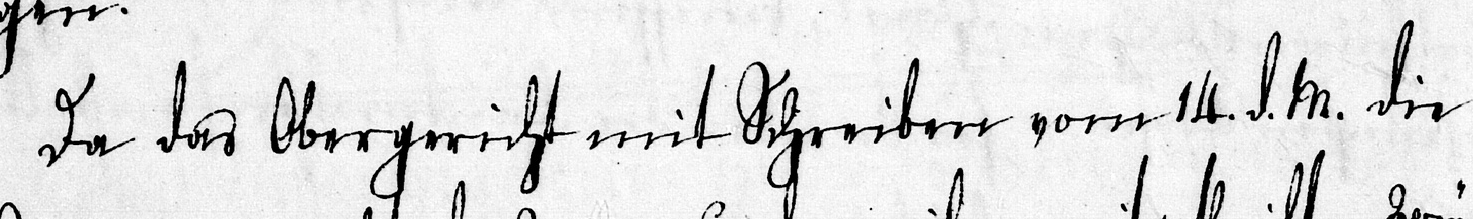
Da das Obergericht mit Schreiben vom 14. d. M. die
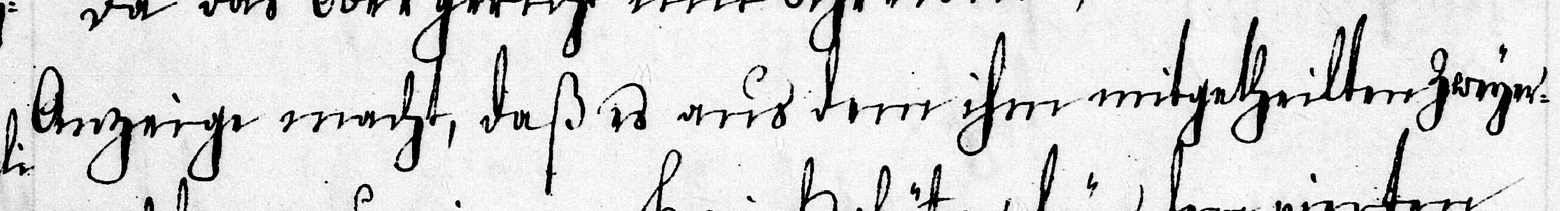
Anzeige macht, daß es aus dem ihm mitgetheilten Zweyer¬
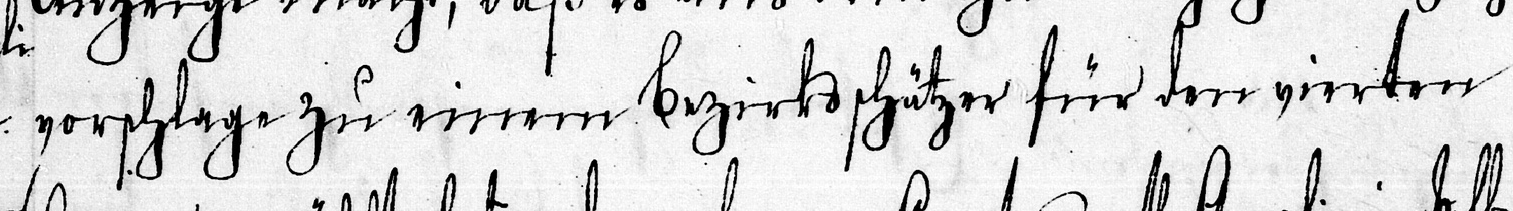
vorschlage zu einem Bezirksschätzer für den vierten
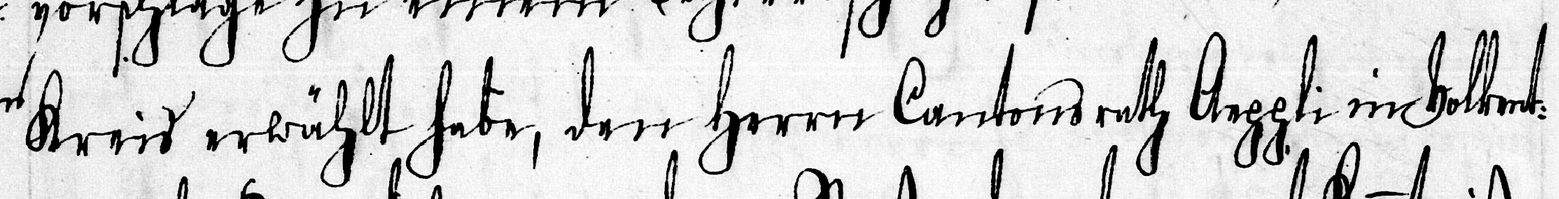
Kreis erwählt habe, den Herrn Cantonsrath Aeppli in Volke¬
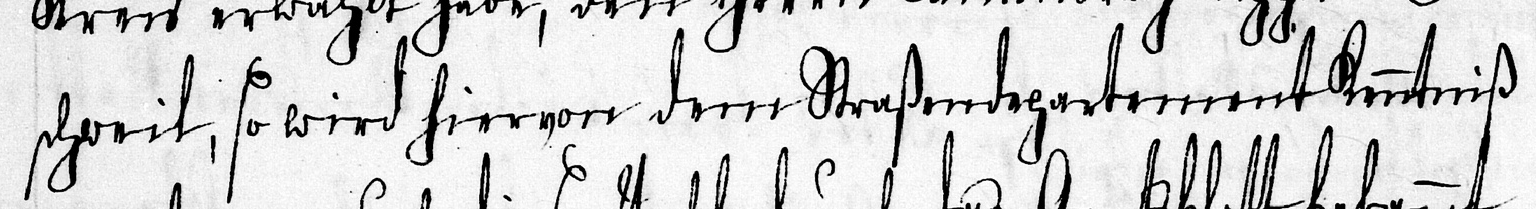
schweil, so wird hiervon dem Straßendepartement Kenntniß
